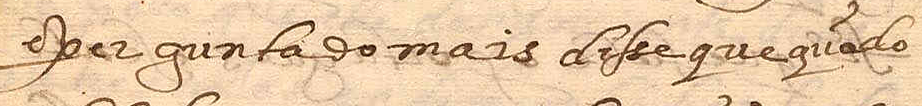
e perguntado mais disse que quādo
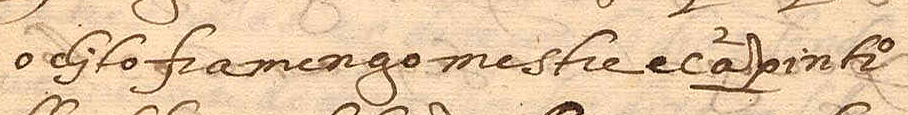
o djto framengo mestre e carpintro
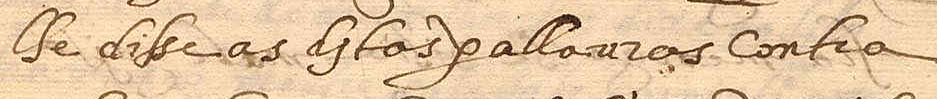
lhe disse as ditas pallauras contra
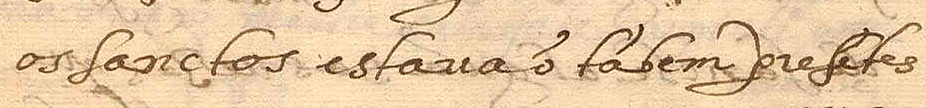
os sanctos estauaõ tābem presētes
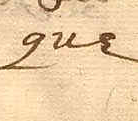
que
